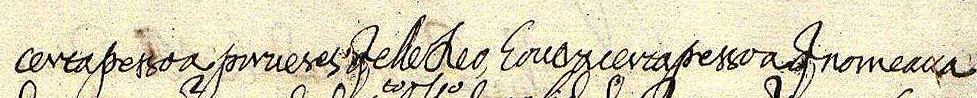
certa pessoa por ueses q̄ elle Reo, houera certa pessoa q̄ nomeaua
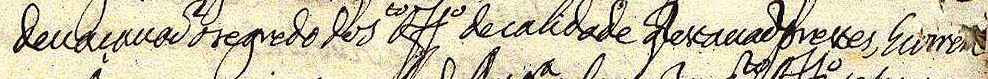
deuaçauaõ o segredo do sto offo de calidade q̄ estauaõ prestes, E corren
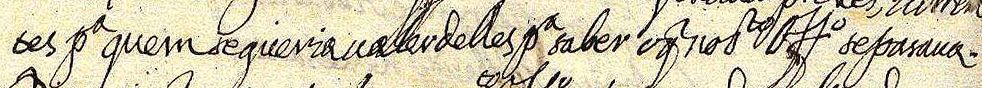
tes pa quem se queria ualler delles pa saber o q̄ no sto Offo se pasaua
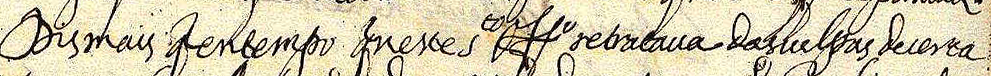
Dis mais q̄ en tempo q̄ neste sto Offo se trataua das culpas de certa
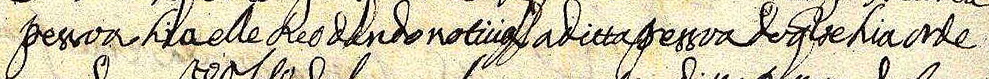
pessoa hia elle Reo dando noticia a ditta pessoa do q̄ se hia orde
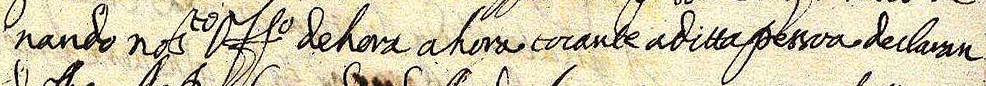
nando no sto Offo de hora a hora tocante a ditta pessoa declaran
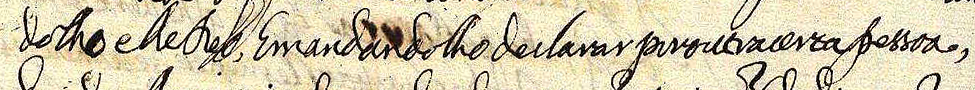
dolho elle Reo, E mandandolho declarar por outra certa pessoa,
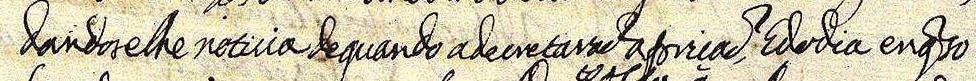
dandoselhe noticia de quando a decretaraõ a priçaõ, E do dia en q̄ so
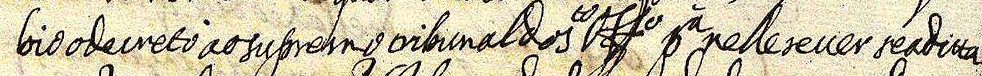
bio o decreto do supremo tribunal do sto Offo pa nelle reuer se a ditta
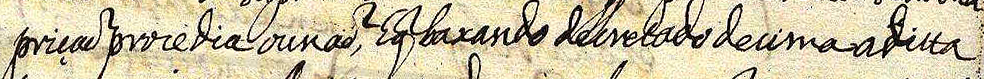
priçaõ procedia ou naõ, E q̄ baxando decretado de cima a ditta
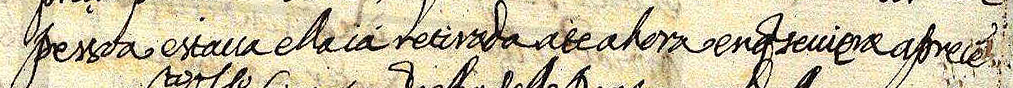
pessoa estaua ella iá retirada atè a hora en q̄ se uiera aprecē
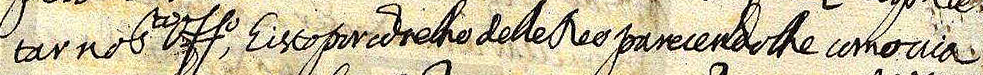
tar no sto Offo, E isto por cōselho delle Reo parecendolhe como uia
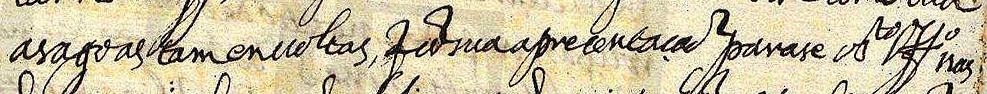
as agoas tam enuoltas, q̄ cō sua aprezentaçaõ parase o sto Offo nas
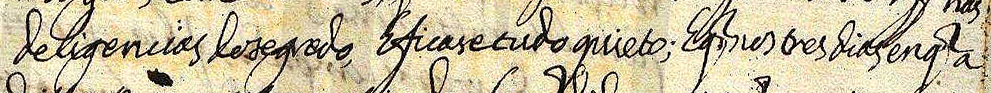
deligencias de segredo, E ficase tudo quieto; E q̄ nos tres dias en q̄ a
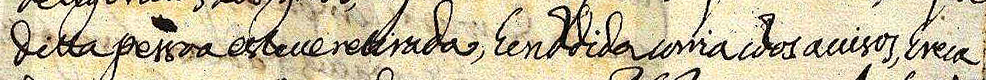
ditta pessoa esteue retirada, E escōdida corria cō os auisos, E reca
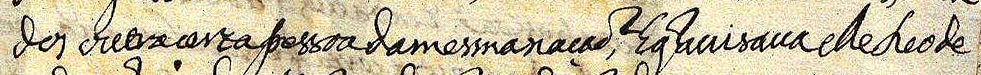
dos outra certa pessoa da mesma naçaõ, E q̄ auisaua elle Reo de
